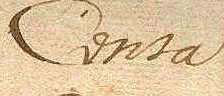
Conta
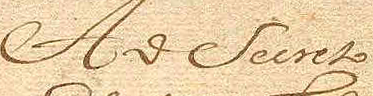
Ao Secreto
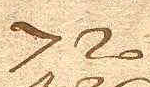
720
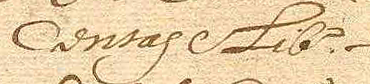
contas e Lib.o
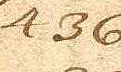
436
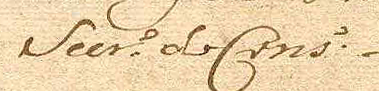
Secr.o do Cons.o
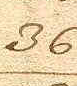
36
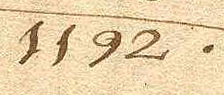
1192.
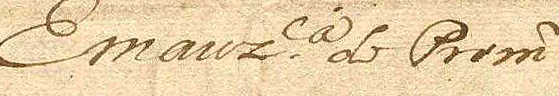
Em auz.ca do Promor.
